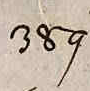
389
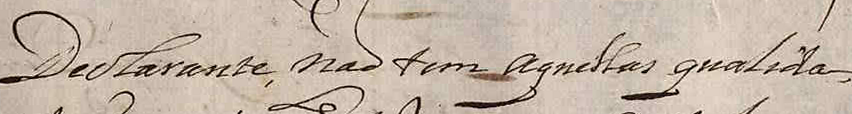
Declarante, naõ tem aquellas qualida
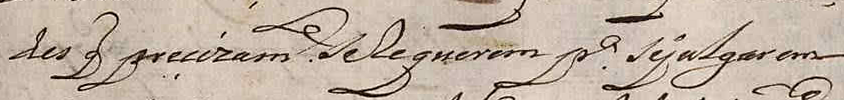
des q̄ precizam.te se Requerem p.a se julgarem
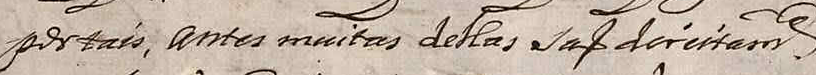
por tais, antes muitas dellas saõ direitamte
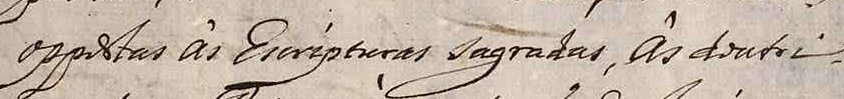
oppostas ás Escripturas sagradas, ás doutri
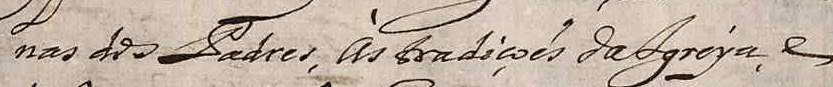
nas dos Padres, às tradicoẽs da Igreya, e
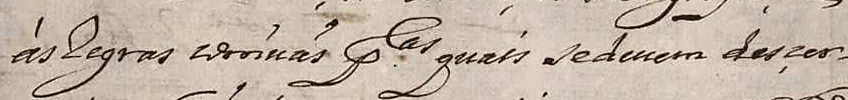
ás Regras comuās p.las quais se deuem descer
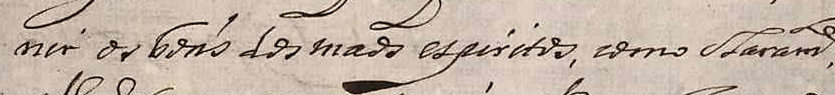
nir os bons dos maos espiritos, como claramte
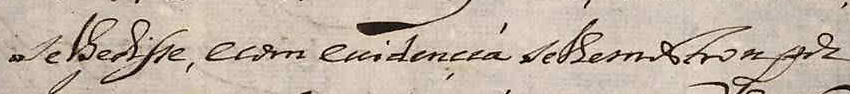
se lhe disse, e com euidencia se lhe mostrou por
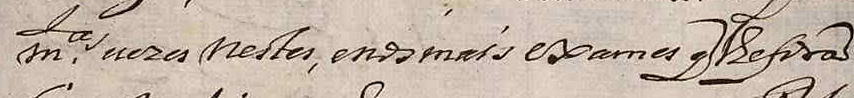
m.tas uezes nestes, e nos mais exames q̄ lhe forão
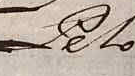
Pelo
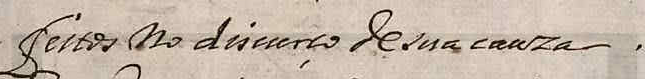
feitos no discurço de sua cauza.
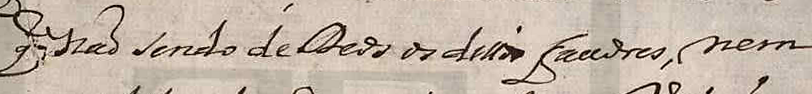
q̄ naõ sendo de Deos os dittos fauores, nem
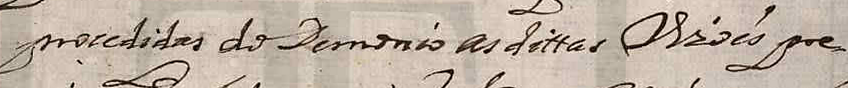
procedidas do Demonio as dittas Vizoẽs pre
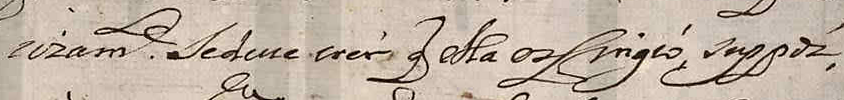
cizam.te se deue crer q̄ ella os fingio, suppos,
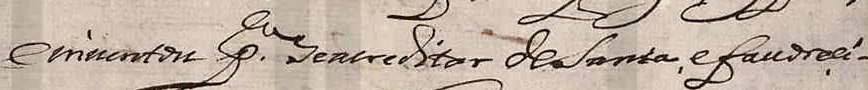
e inuentou p.ra se acreditar de Santa, e fauoreci
